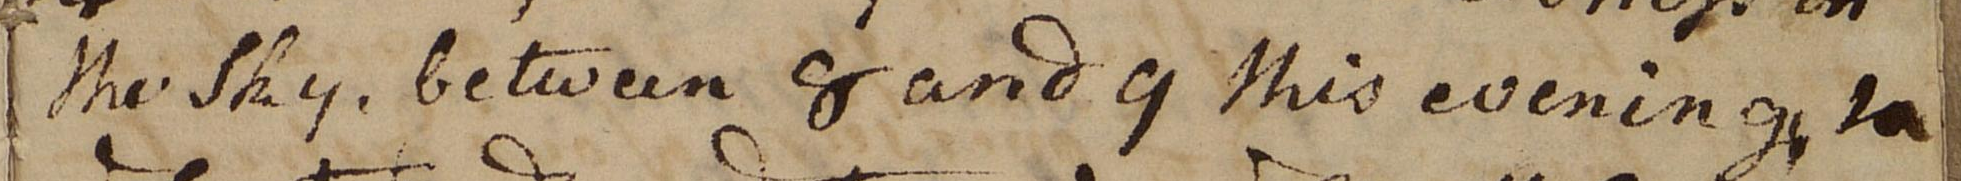the Sky, between 8 and 9 this evening, to
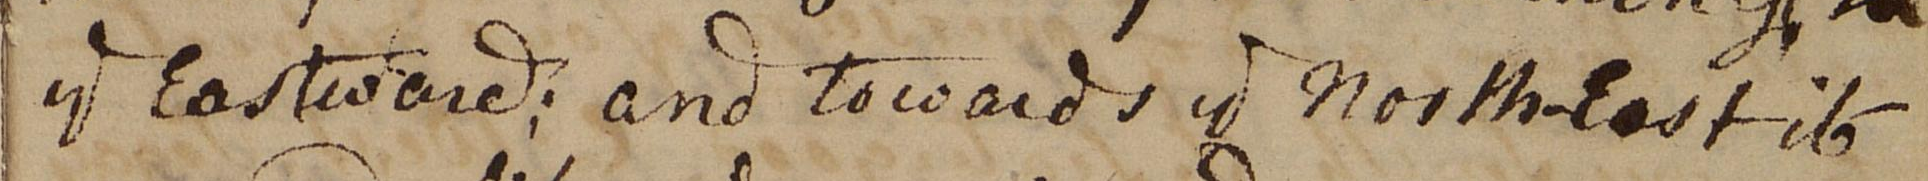y^e Eastward; and towards y^e Norht-East it
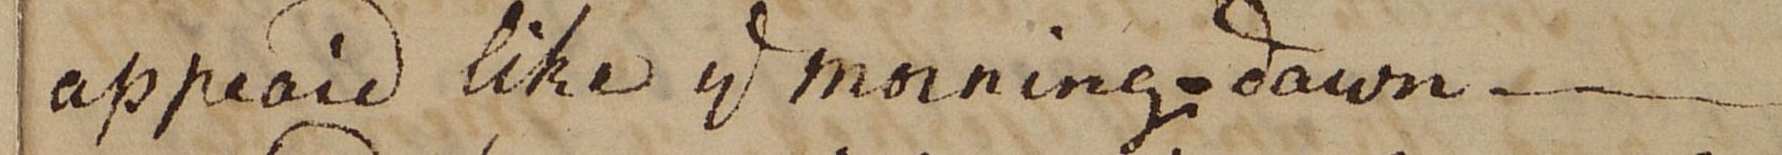appear'd like y^e morning-dawn-
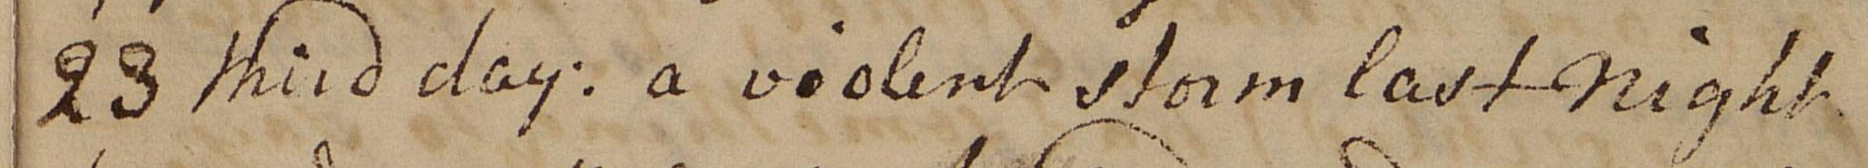23 third day: a violent storm last Night
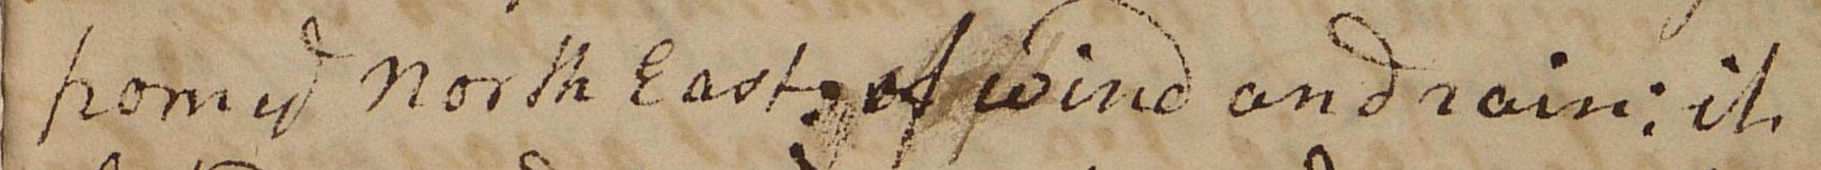from y^e North East: of wind and rain; it
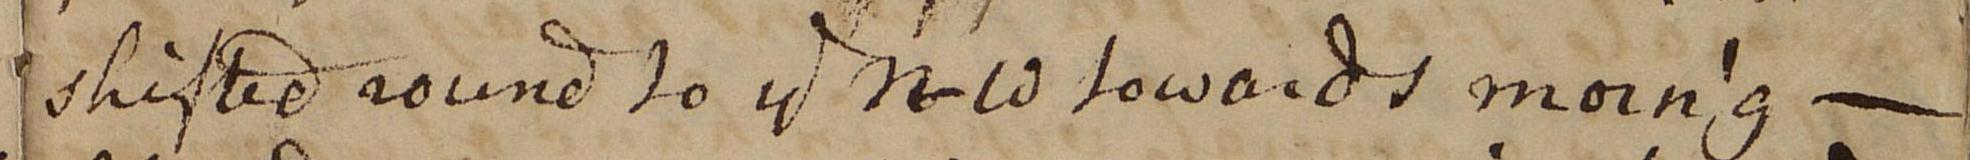shifted round to y^e NW towards morn'g-
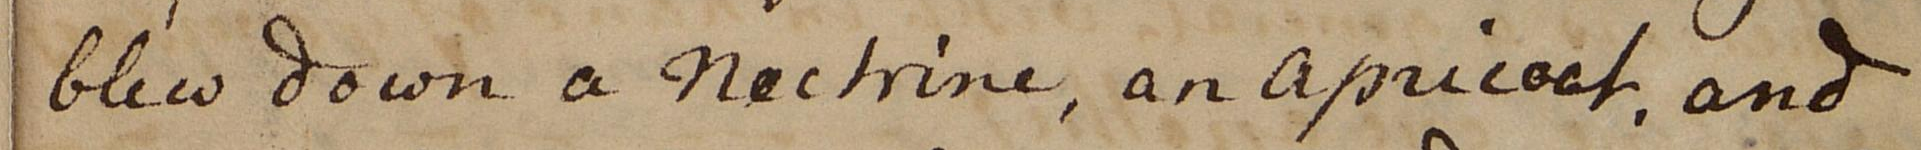blew down a Nectrine, an apricoat and
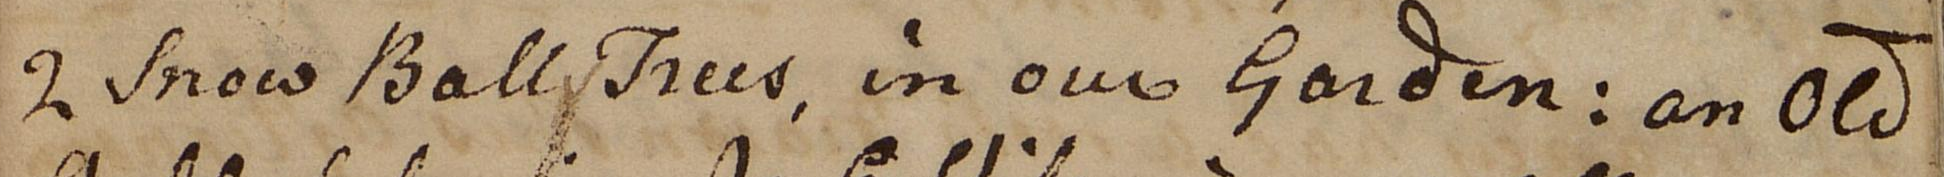2 Snow Ball Trees, in our Garden: an OW
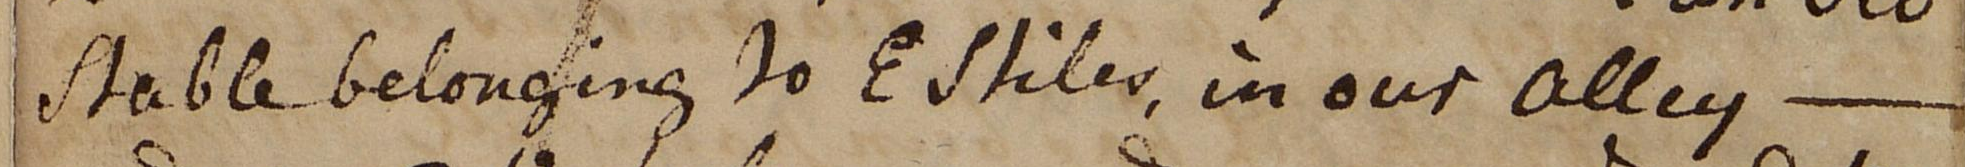Stable belonging to E Stiles, in our alley-
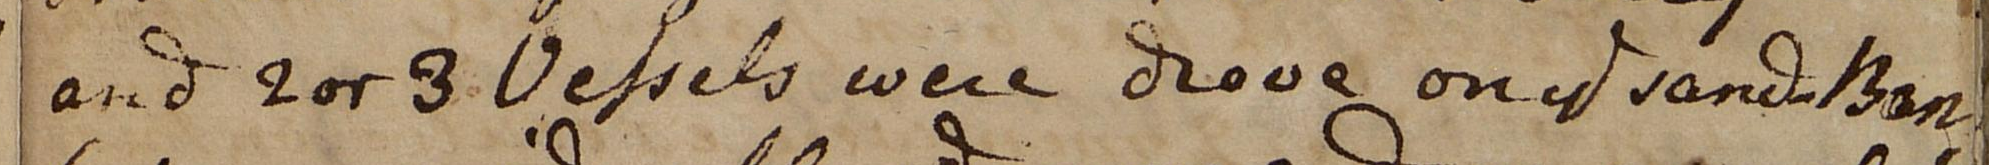and 2 or 3 Vessels were drove on y^e sand-Bar
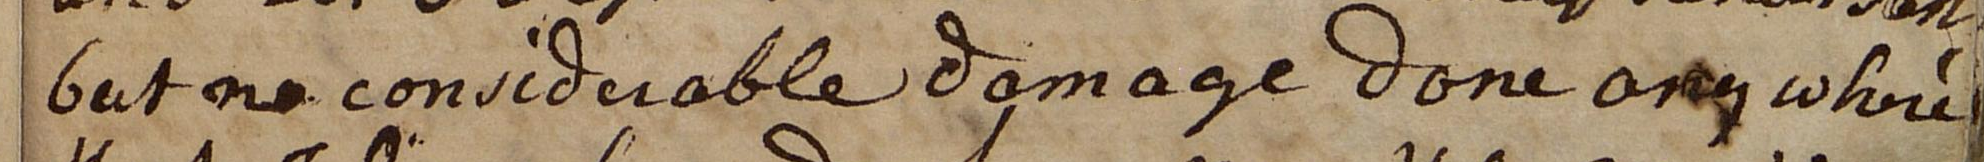but no considerable damage done any where
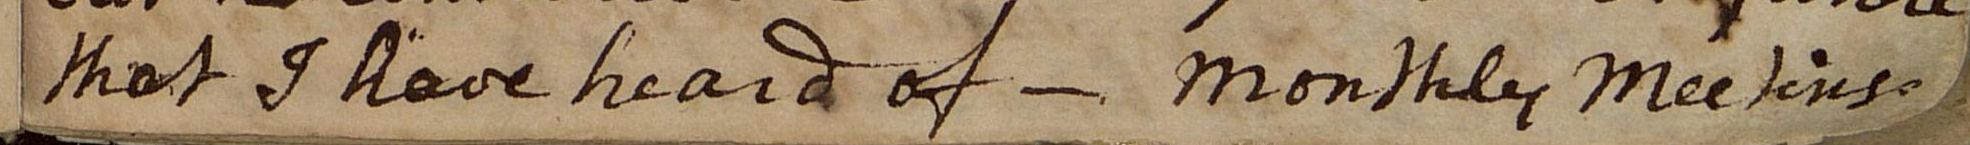that I have heard of- monthly meetimg
